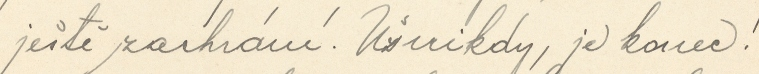ještě zachrání. Už nikdy, je konec!
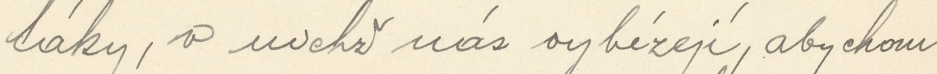táky, v nichž nás vybízejí, abychom
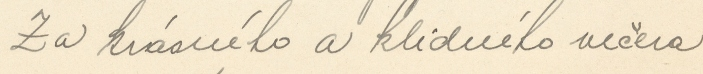Za krásného a klidného večera
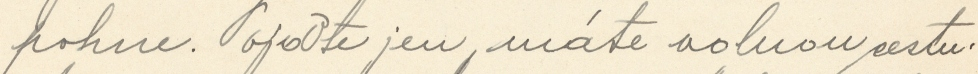pohne. Pojďte jen, máte volnou cestu!
